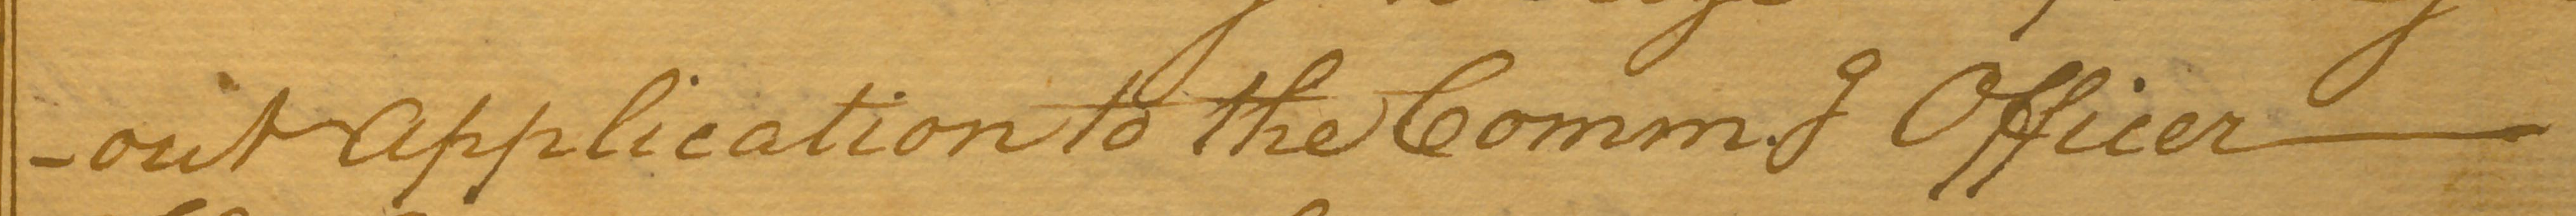-out Application to the Comm^g. Officer-
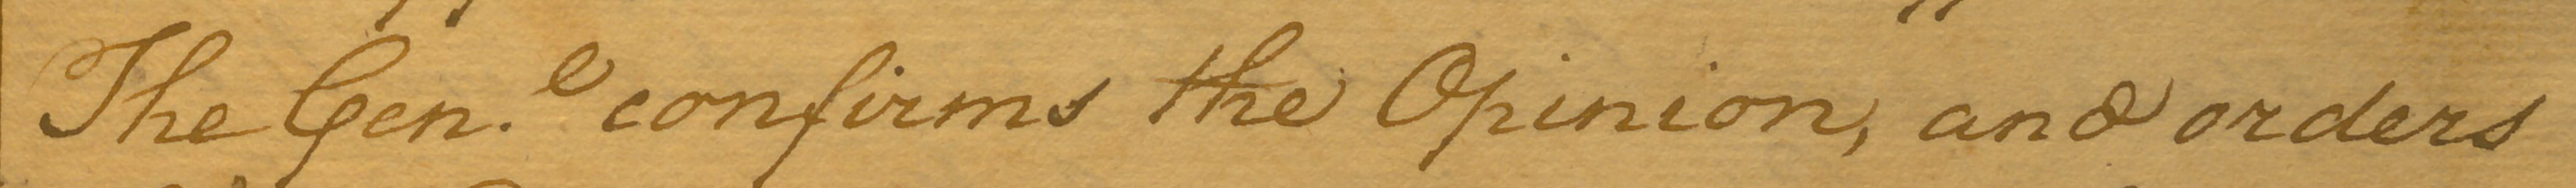The Gen^l. confirms the Opinion, and orders
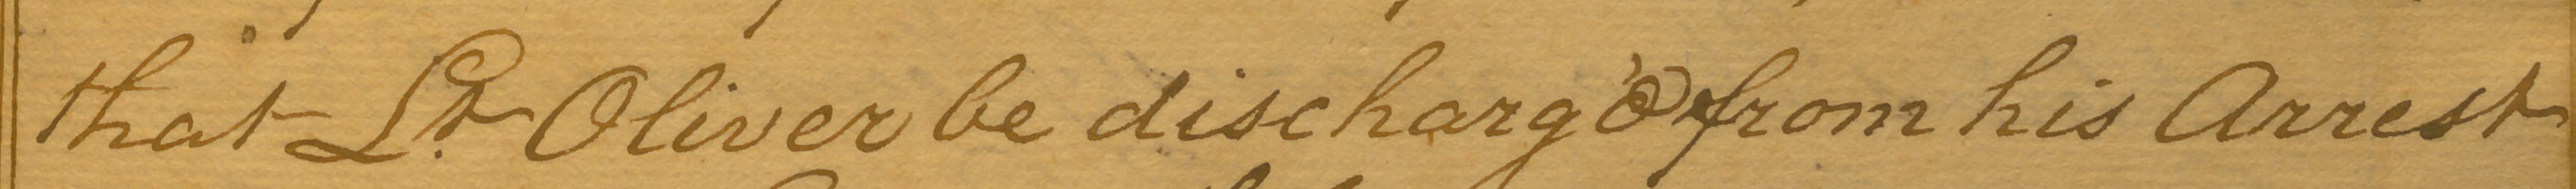that L^t. Oliver be discharg'd from his Arrest
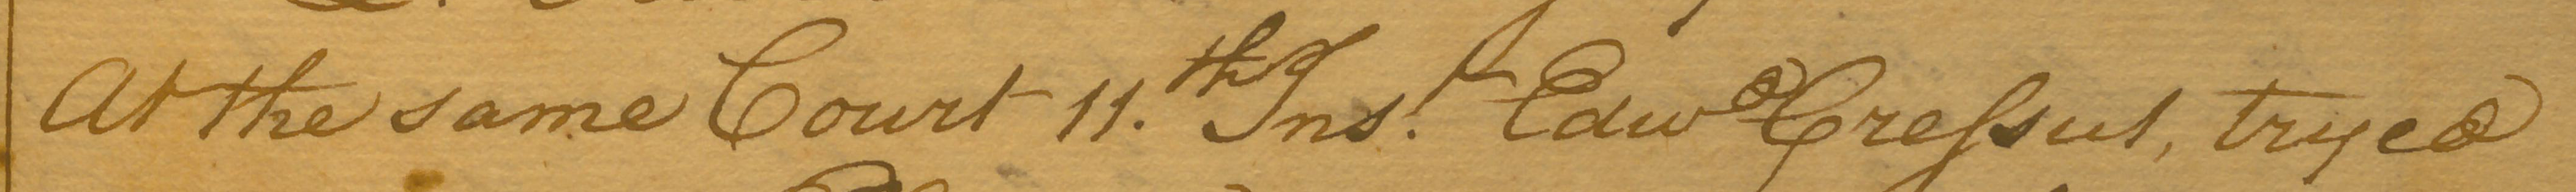At the same Court 11^th. Ins^t. Edw^d. Gressus, tryed
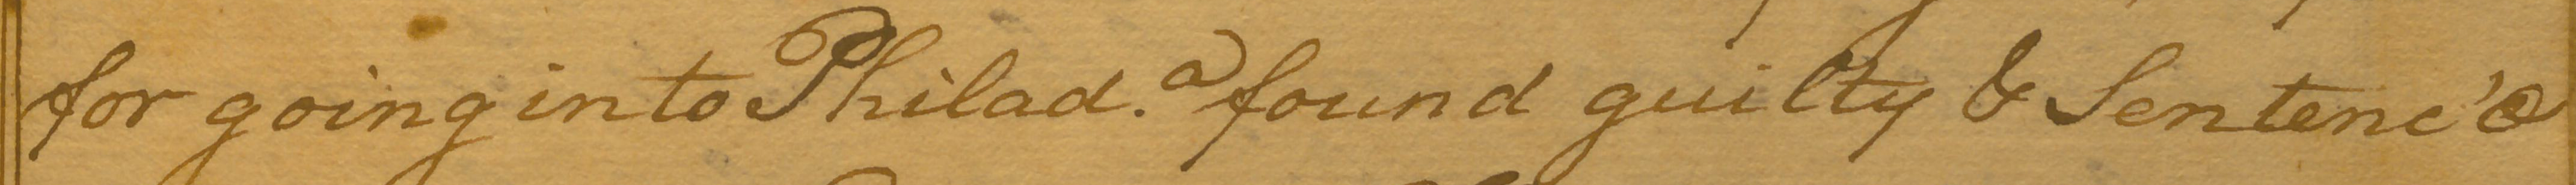for going in to Philad^a. found guilty & sentenc'd
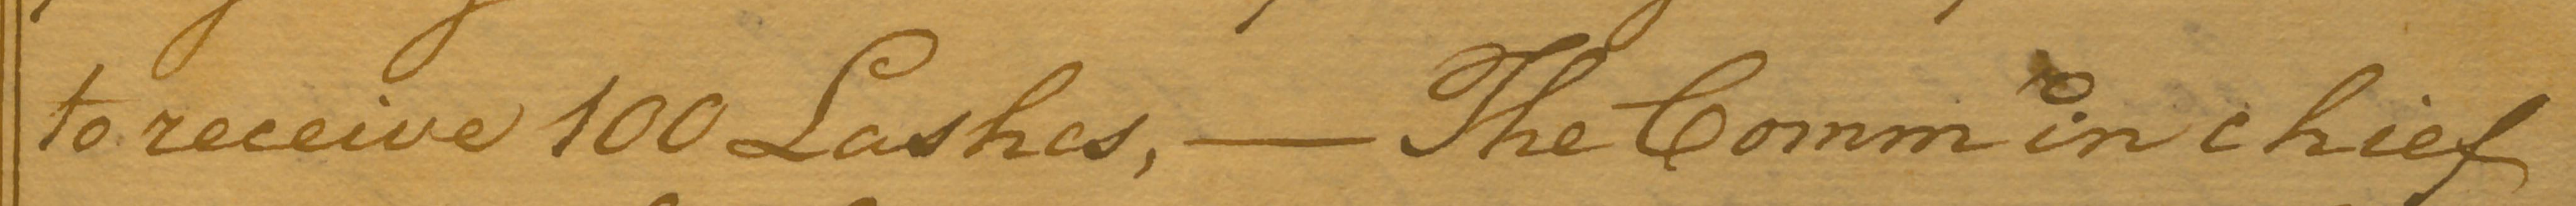to receive 100 Lashes,- The Comm^r in chief
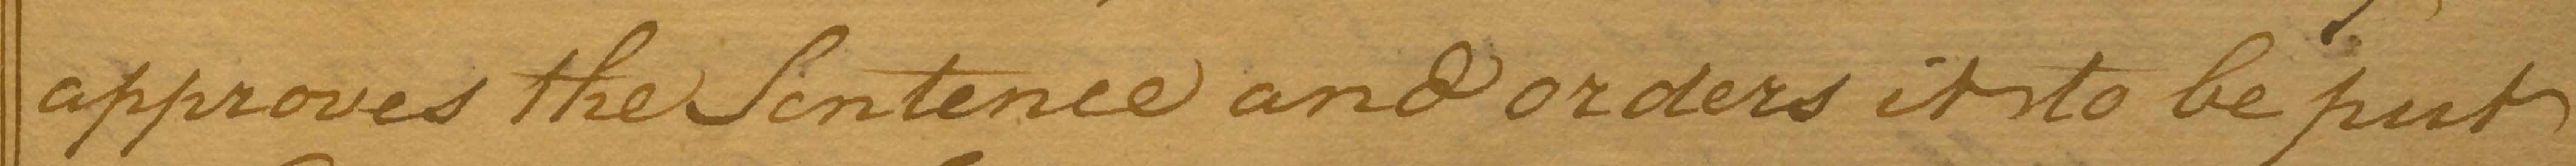approves the sentence and orders it to be put
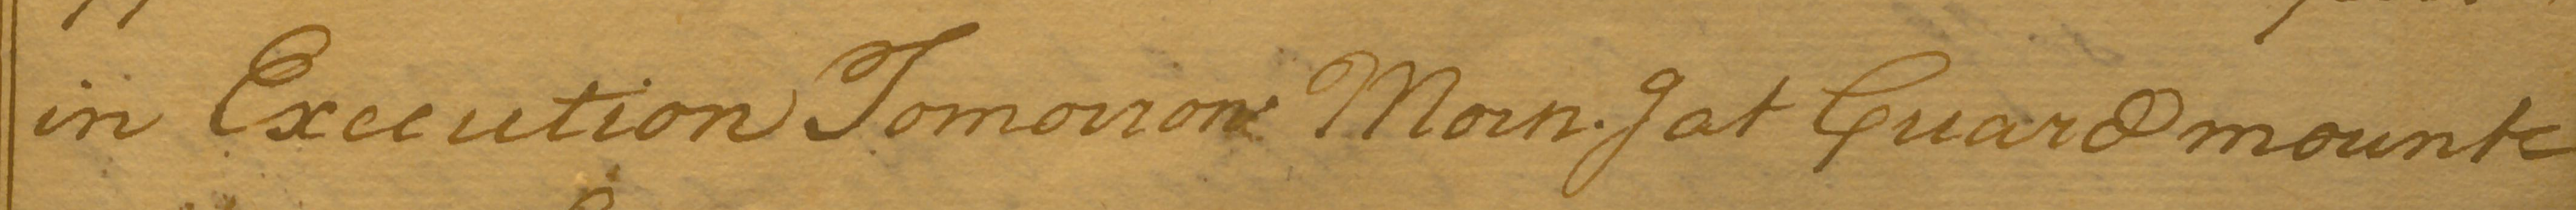in Execution Tomorrow Morn^g. at Guard mount-
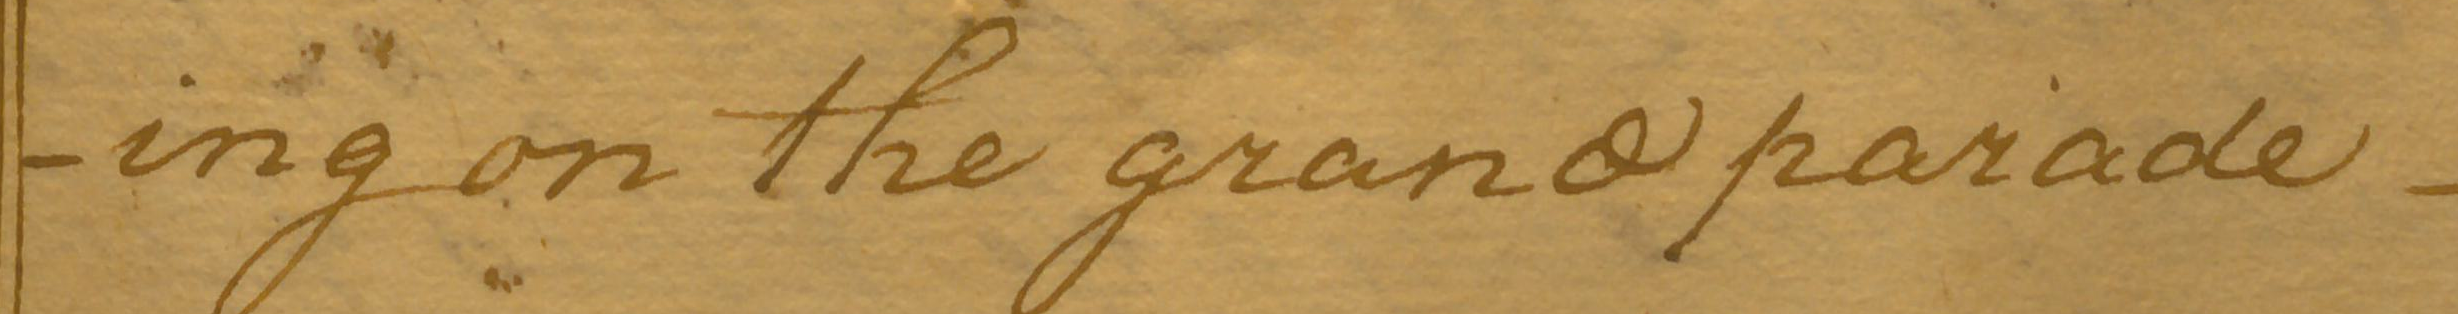-ing on the grand parade-
